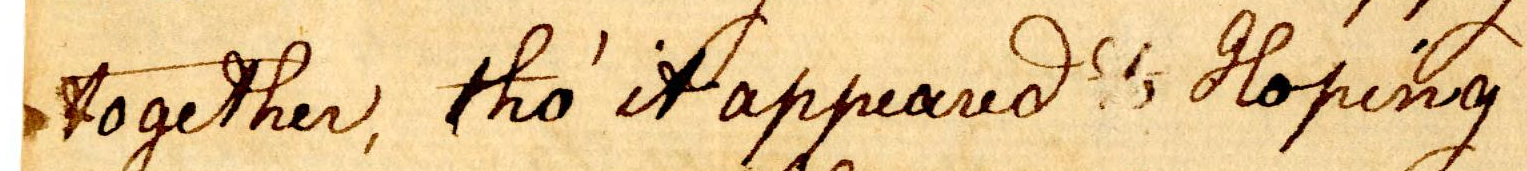together, tho' it appeared to Hoping
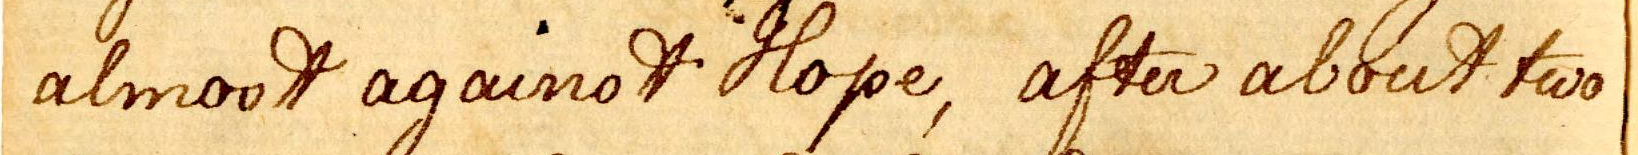almost against Hope, after about two
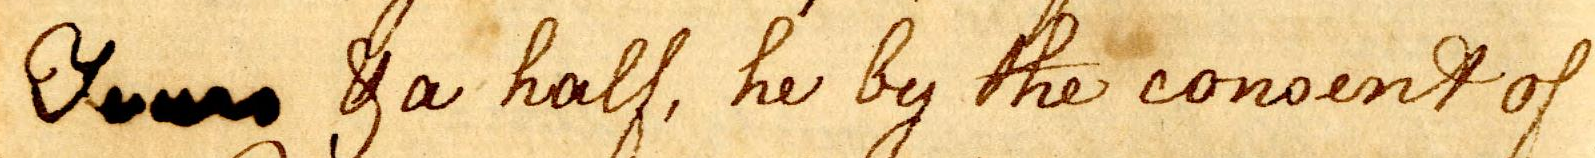Years & a half, he by the consent of
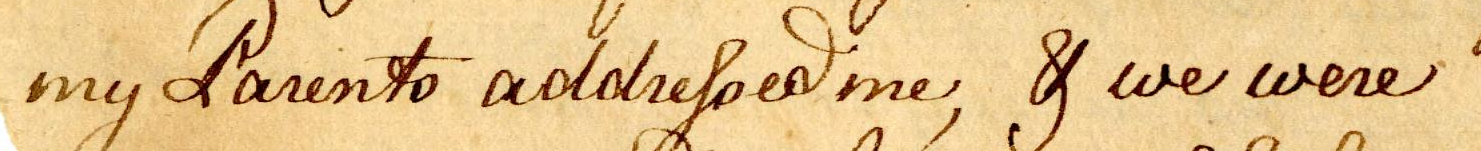my Parents addressed me, & we were
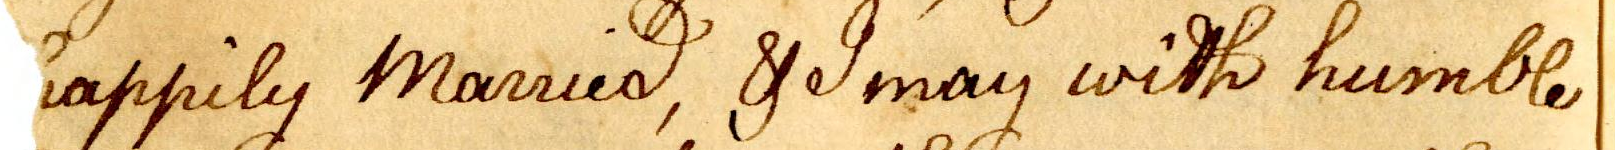happily Married, & I may with humble
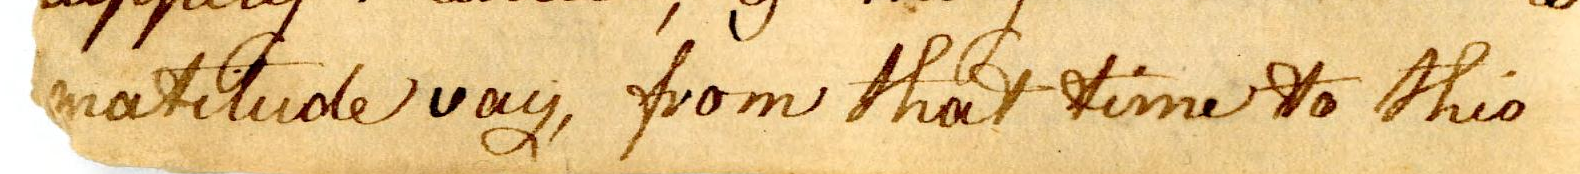gratitude say, from that time to this
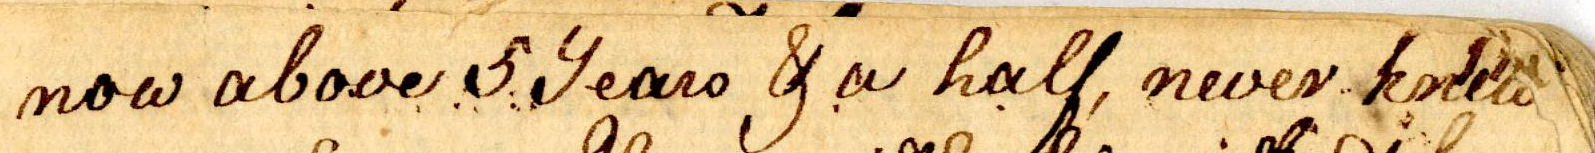now above 5 Years & a half, never knew
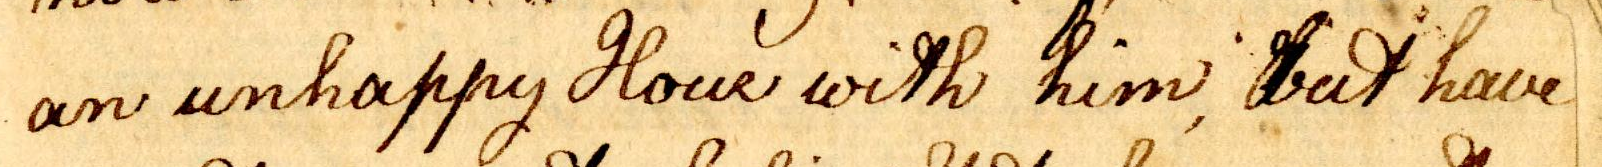an unhappy Hour with him, but have
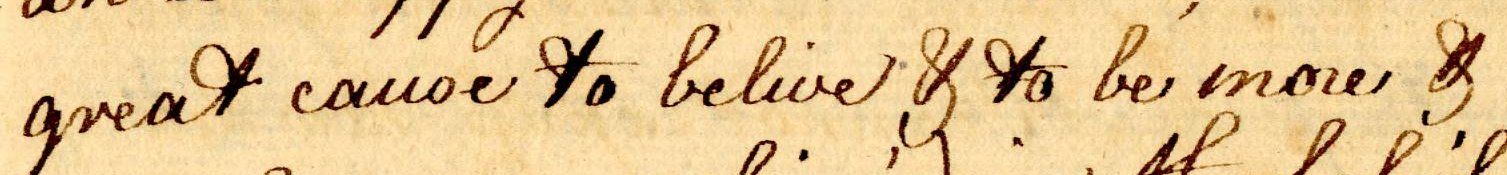great cause to belive & to be more &
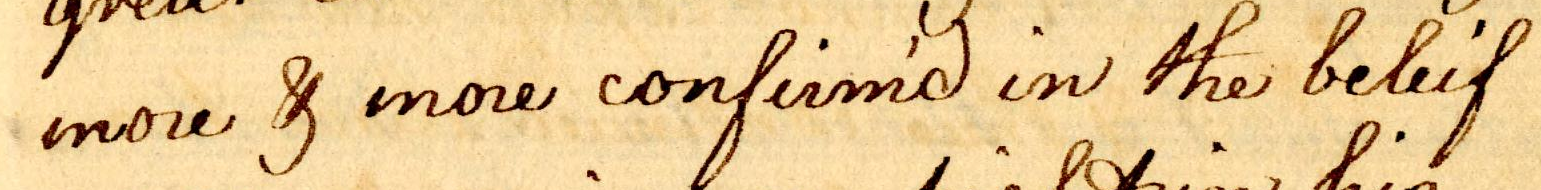more & more confirm'd in the beleif
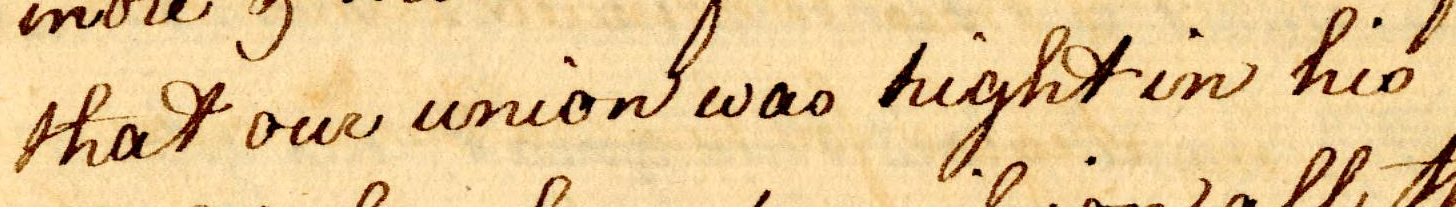that our union was hight in his
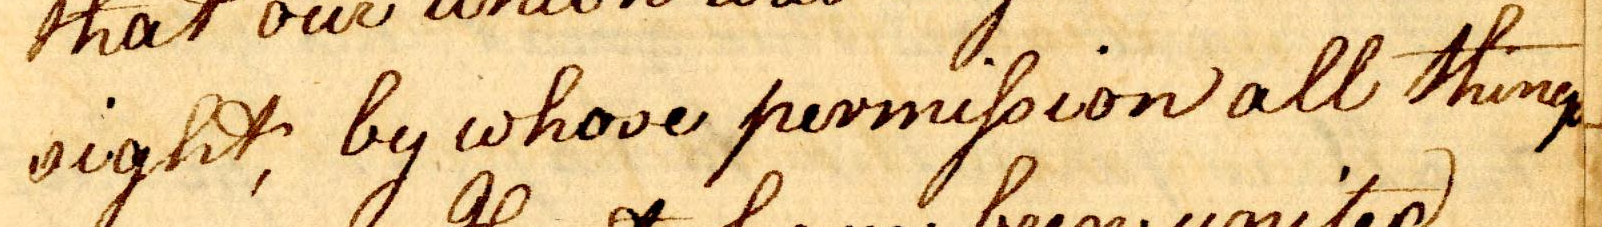sight, by whose permission all things
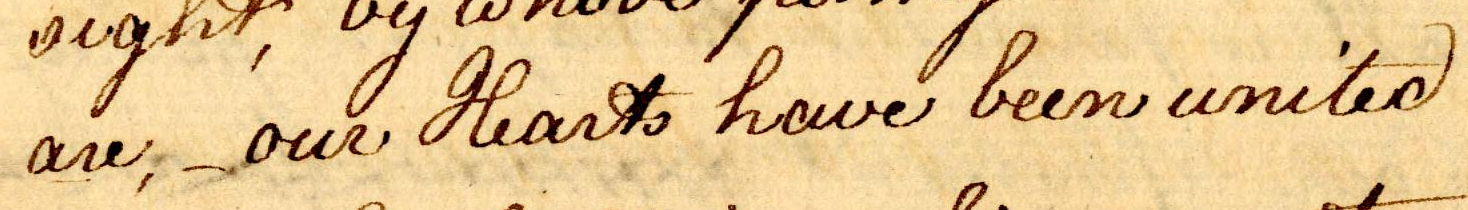are,- our Hearts have been united
